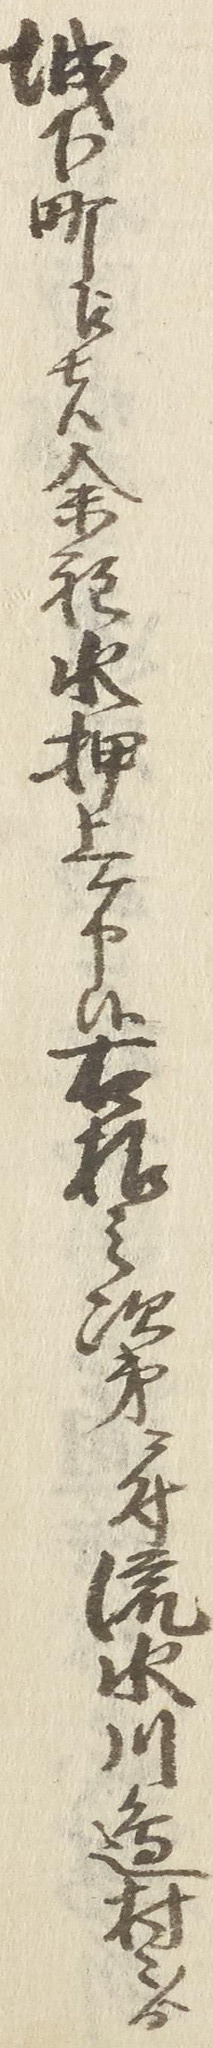城下町江は余程水押上ヶ申候右様之次第二付流水川辺村々ゟ
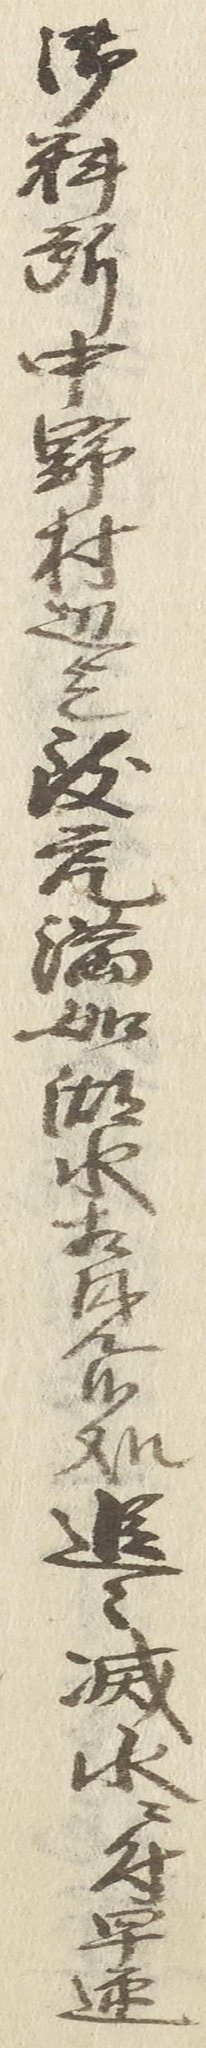御料所中野村辺迄致充満如湖水相見候処追々減水二付早速

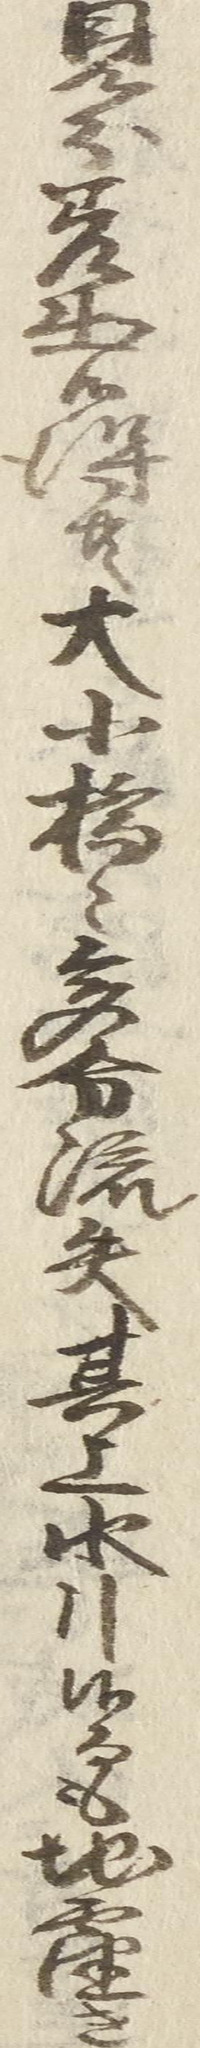見分差出候得共大小橋々多分流失其上水引候而も地窪き
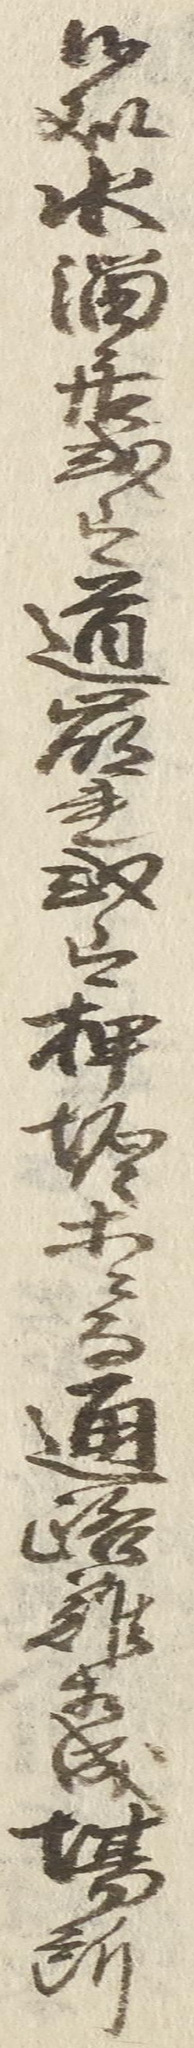候処水溜居或は道崩れ或は押掘等ニ而通路難相成場所
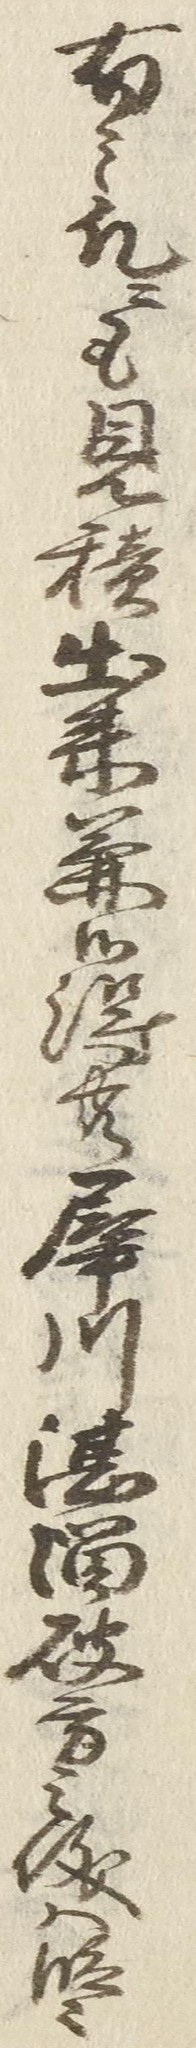有之凡ニも見積出来兼候得共犀川湛溜破方之儀は段々
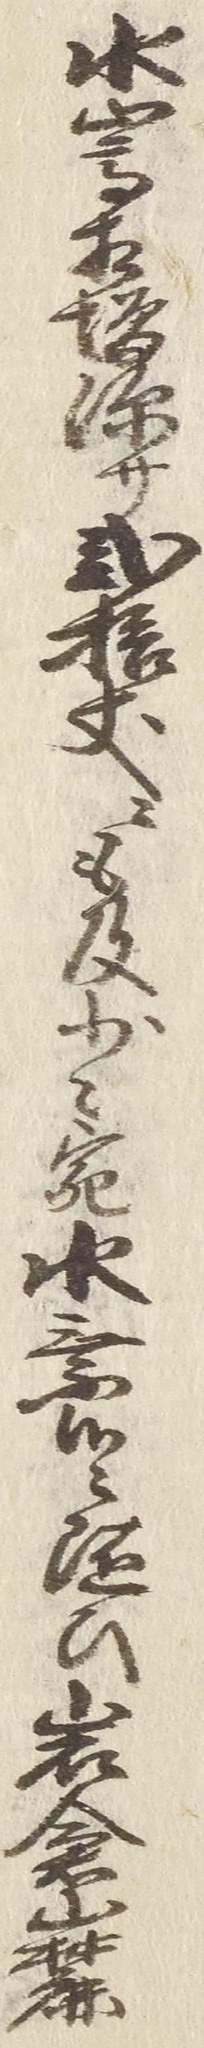水嵩相増深サ弐拾丈ニも及少々宛水乗候ニ随ひ岩倉山麓
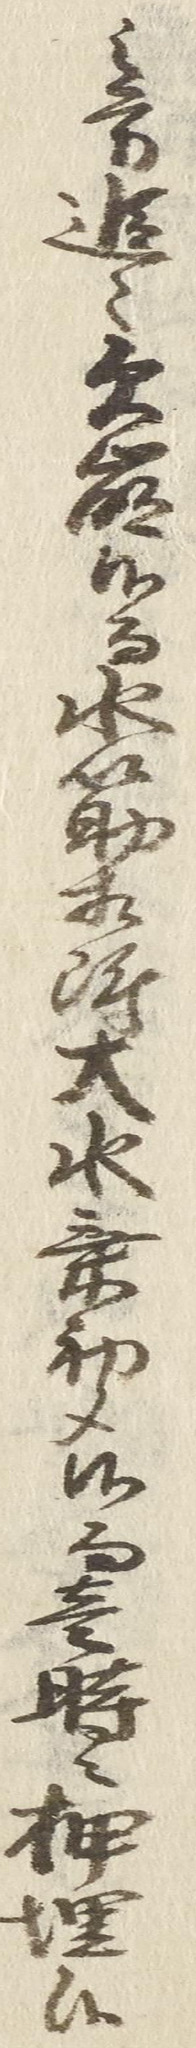之方追々欠崩候而水筋相附大水乗初メ候而壱時々押埋候
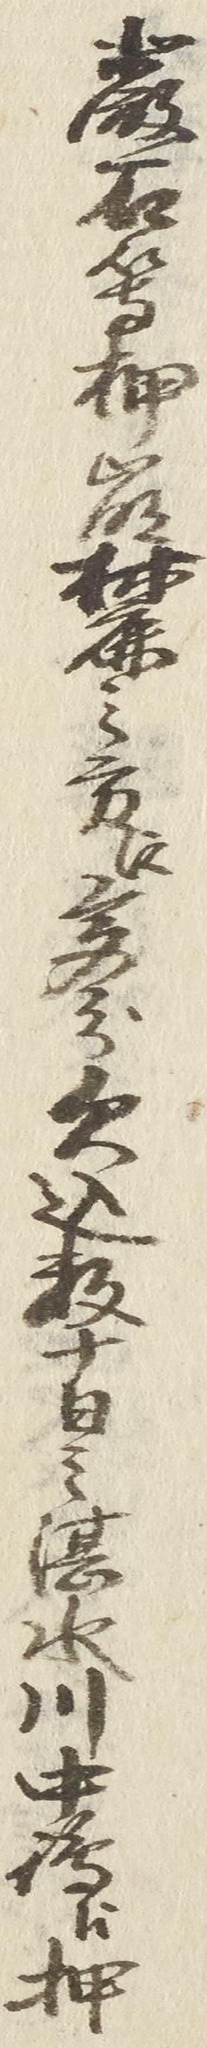厳石等押崩麓之方江多分欠込数十日之湛水川中嶋江押
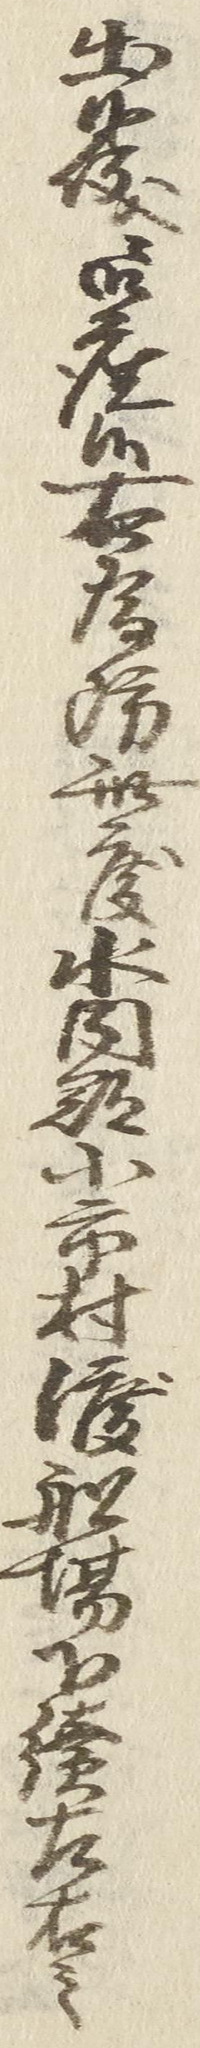出候儀ニ御座候右為防此度水内郡小市村渡船場下続左右之
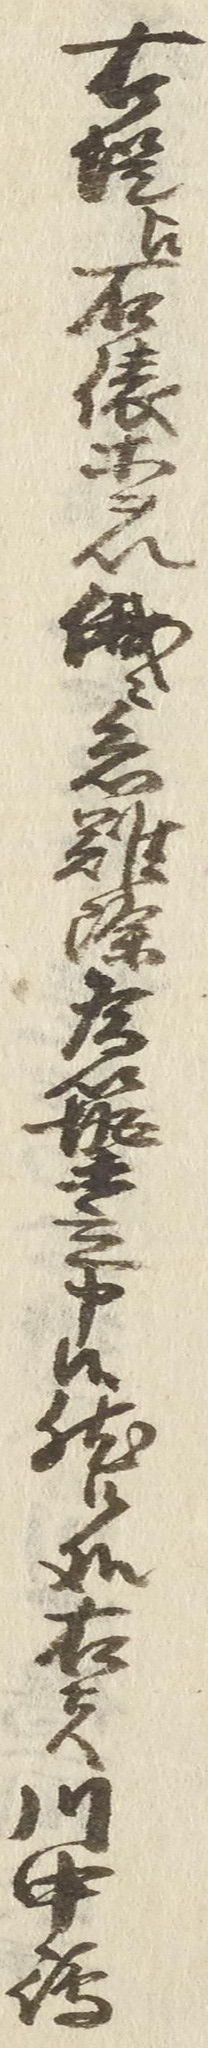古堤江石俵等ヲ以俄ニ急難除為築立申候然ル処右は川中嶋
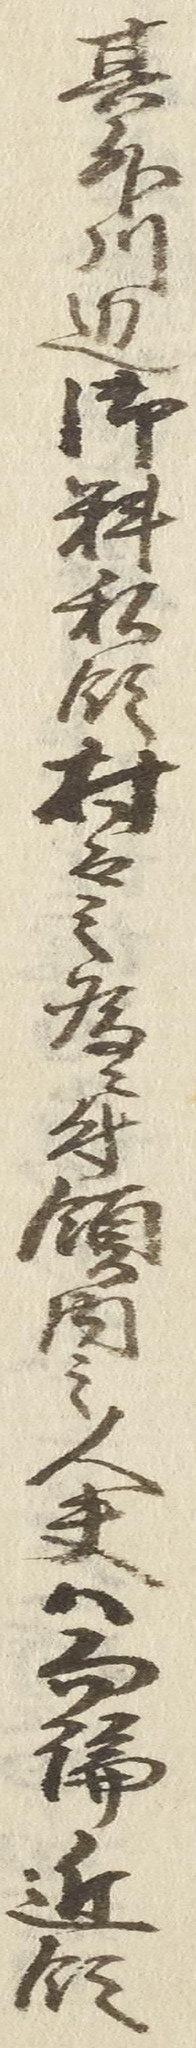其外川辺御料私領村々之為ニ付領内之人夫は勿論近領
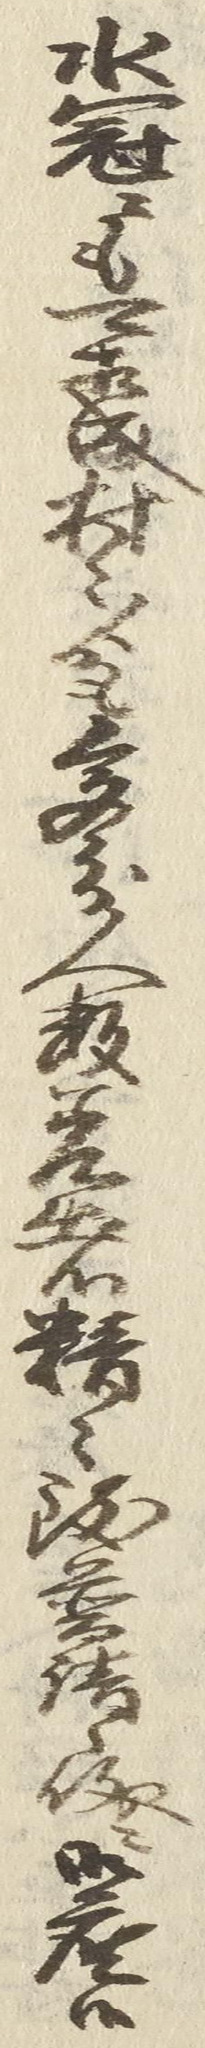水冠ニも可相成村々ゟも多分人数差出候精々致普請候儀ニ御座候
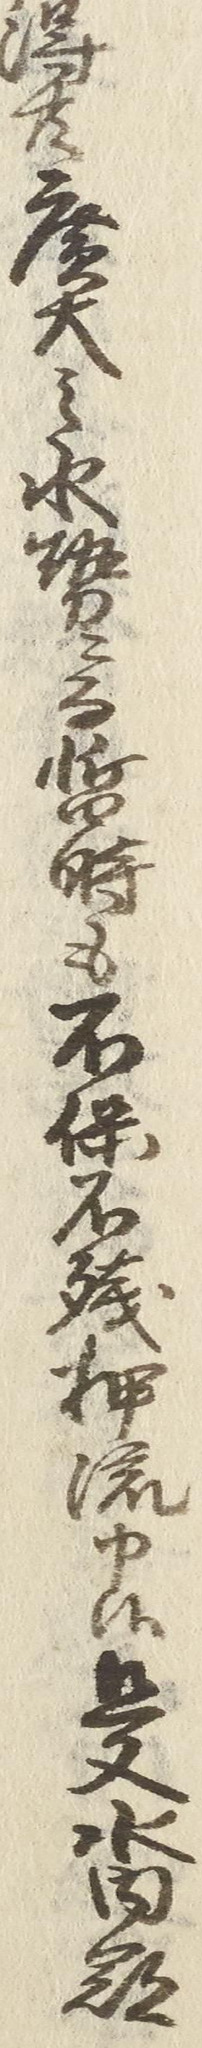得共広大之水勢ニ而暫時も不保不残押流申候且又水内郡
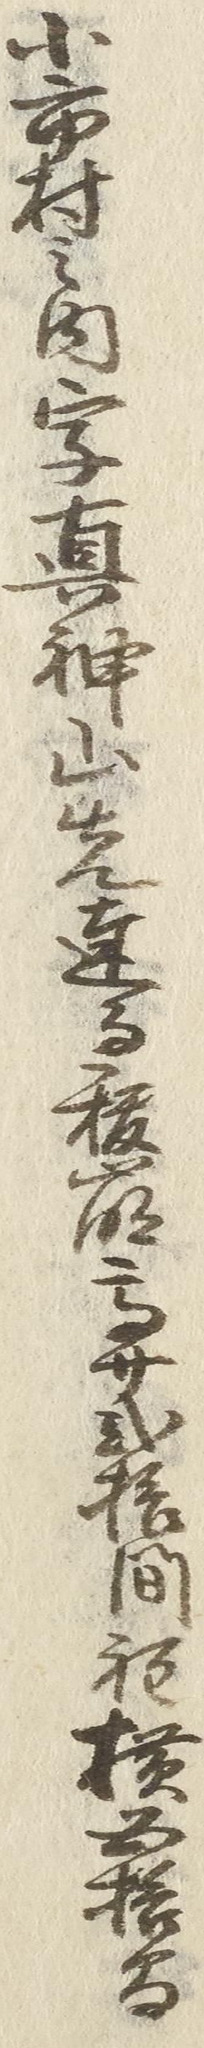小市村之内字真神山先達而抜崩高サ弐拾間程横五拾間
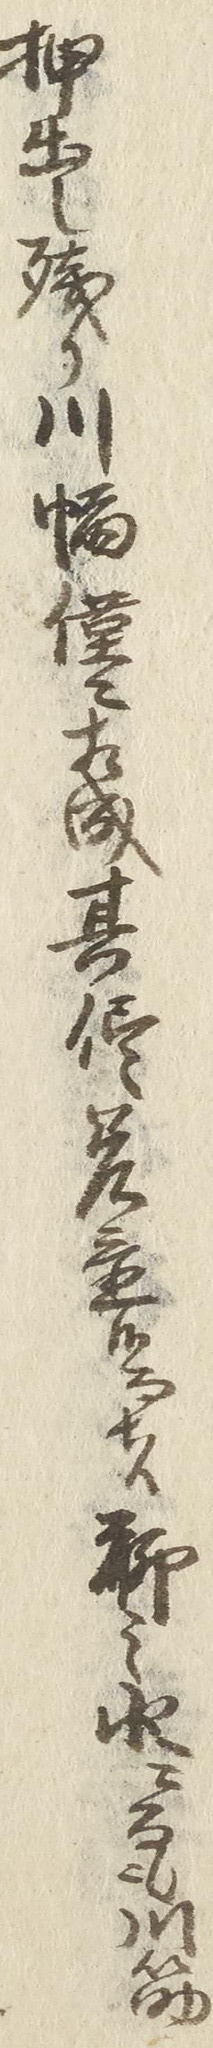押出し残り川幅僅ニ相成其侭差置候而は聊之水ニ而も川筋
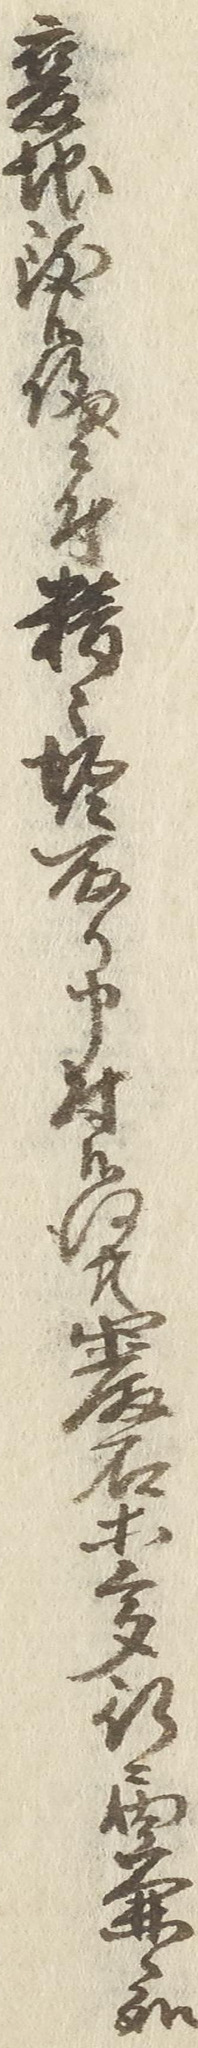変地致候儀ニ付精々掘取り申付候得共巌石等多行届兼候処
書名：従往古地震御届書記誌之一
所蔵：東京大学地震研究所図書室 Earthquake Research Institute Library, The University of Tokyo, JAPAN
